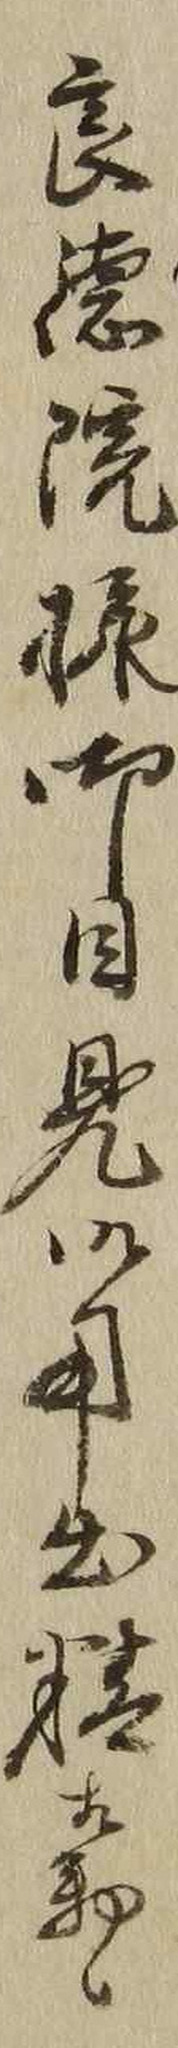良徳院様御目見御用出精相勤
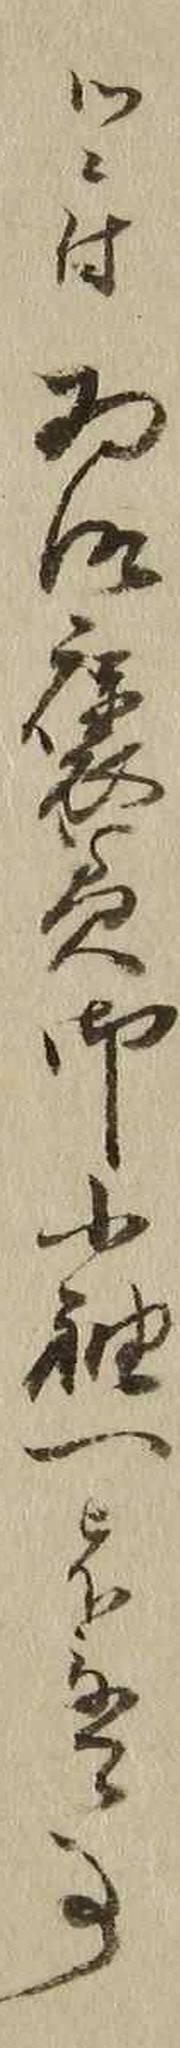候ニ付為御褒美御小袖一被下置候事
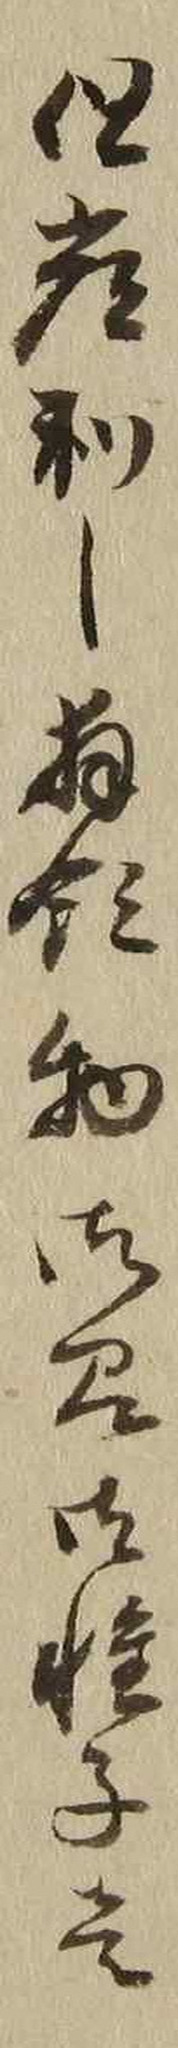但常和之拝領物御召御帷子壱
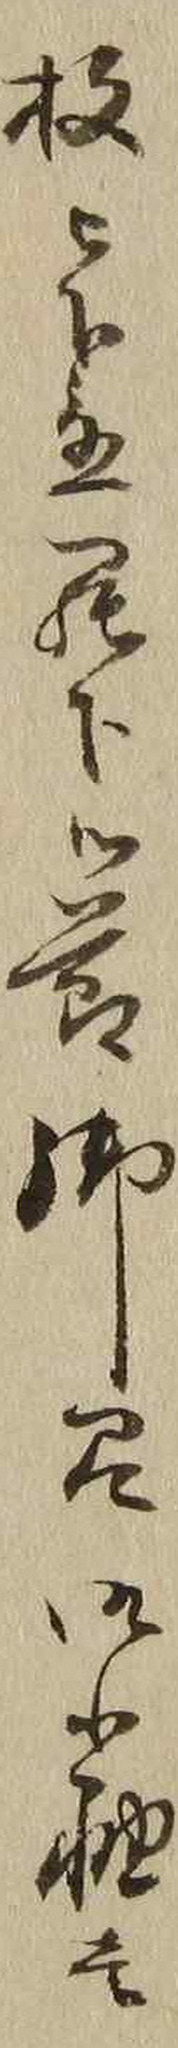枚被下置罷下候節御召御小袖壱
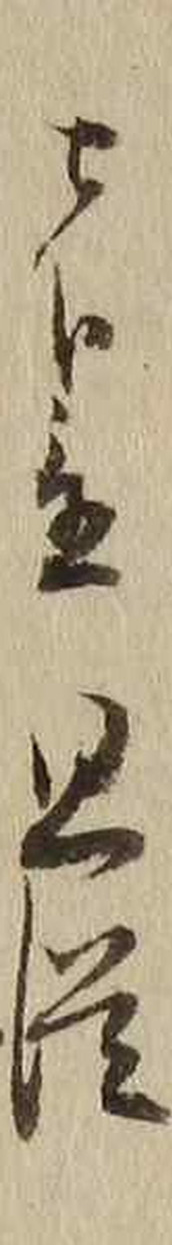被下置且従
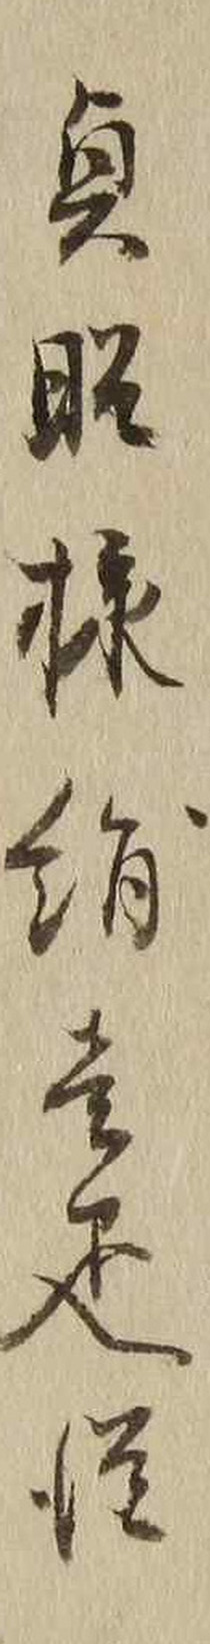貞昭様絹壱疋従
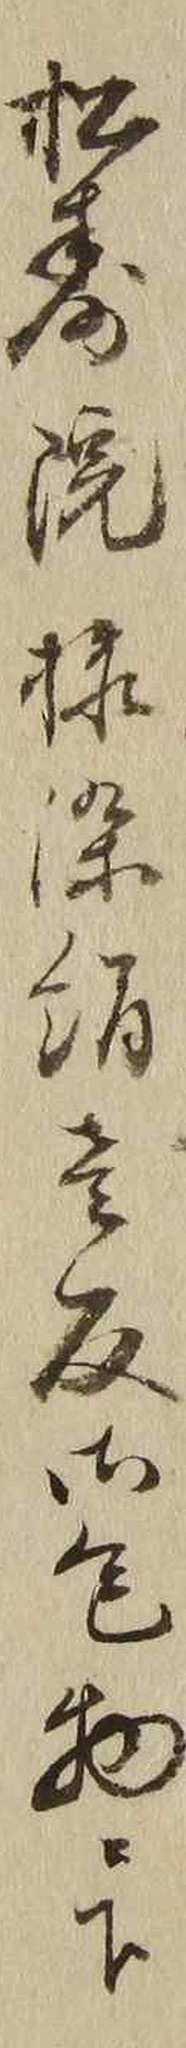松寿院様染絹壱反御包物被下
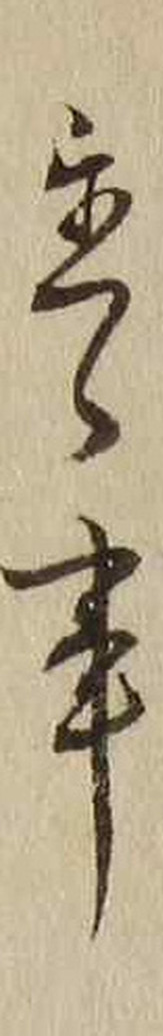置候事
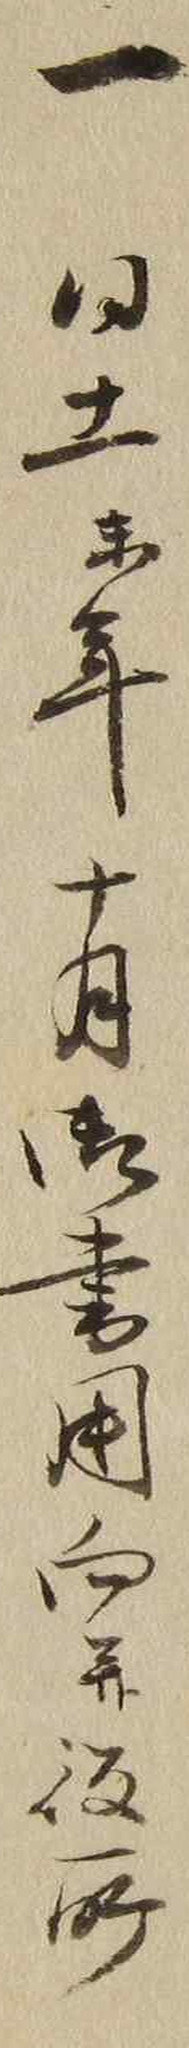一同十一未年十月御書用向并役所
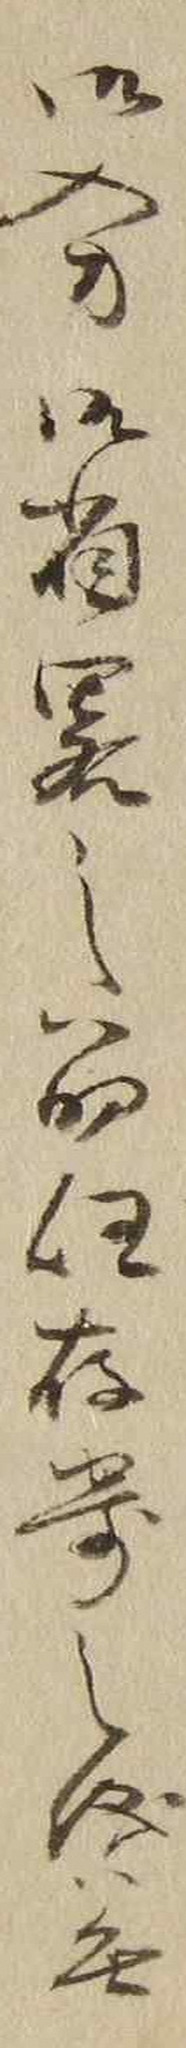御入方御省略之筋任存寄之儀ハ無
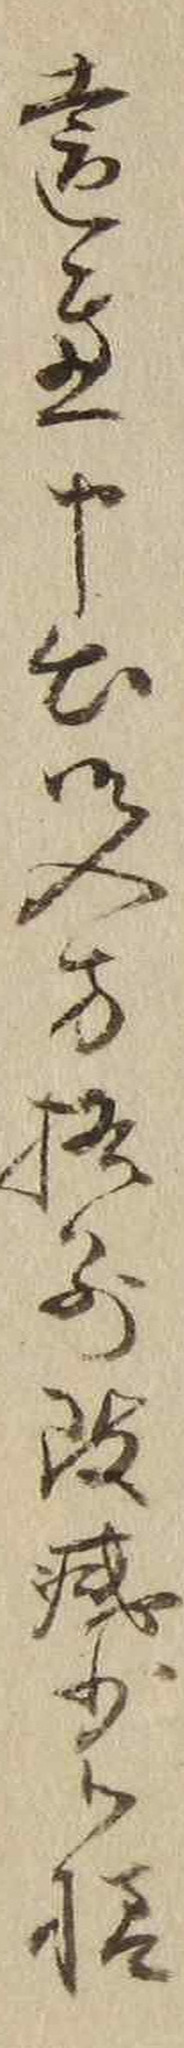遠慮申出御入方格別致減少候様
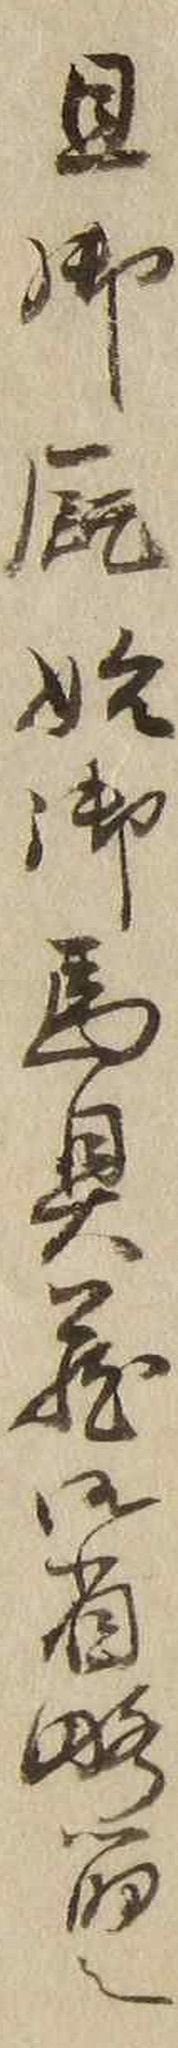旦御厩始御馬具蔵御省略筋之

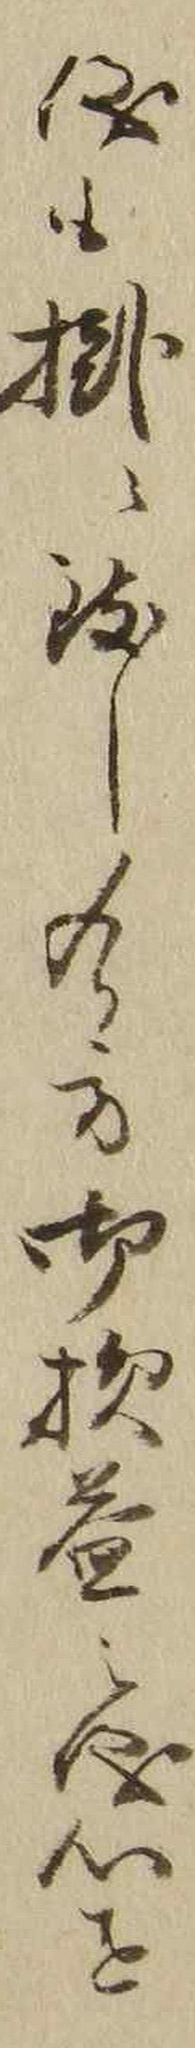儀も掛ニ致し〆り方御損益之儀心を
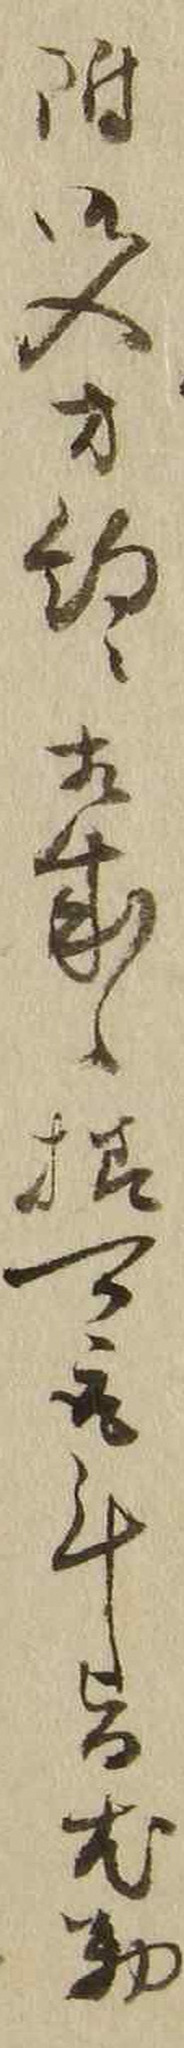附御入方約ニ相成候様可取計旨尤勤
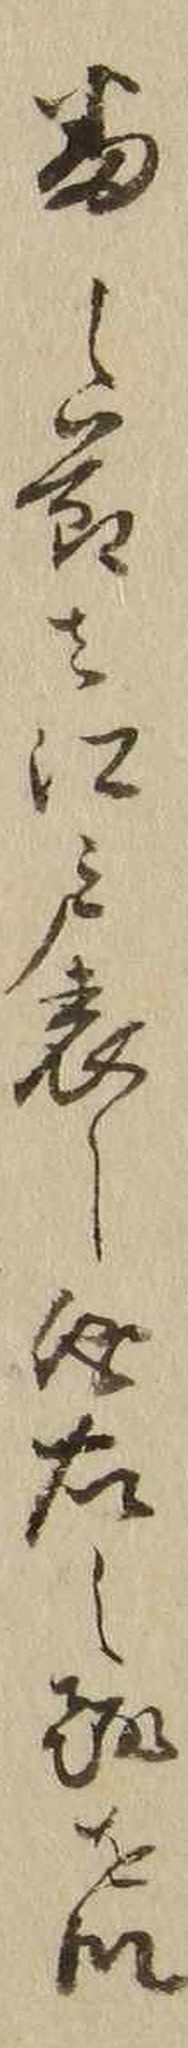番之節者江戸表之儀右之趣を以
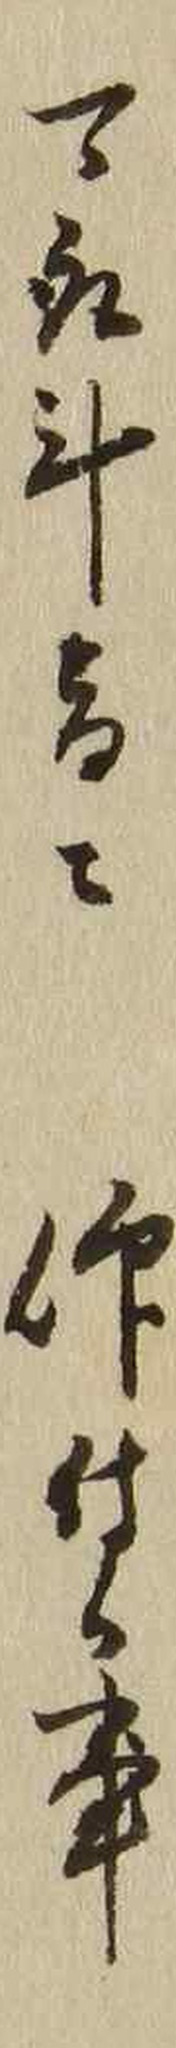可取計旨被仰付候事
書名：諸士系譜　巻之225　ま之部6
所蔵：会津若松市立会津図書館
